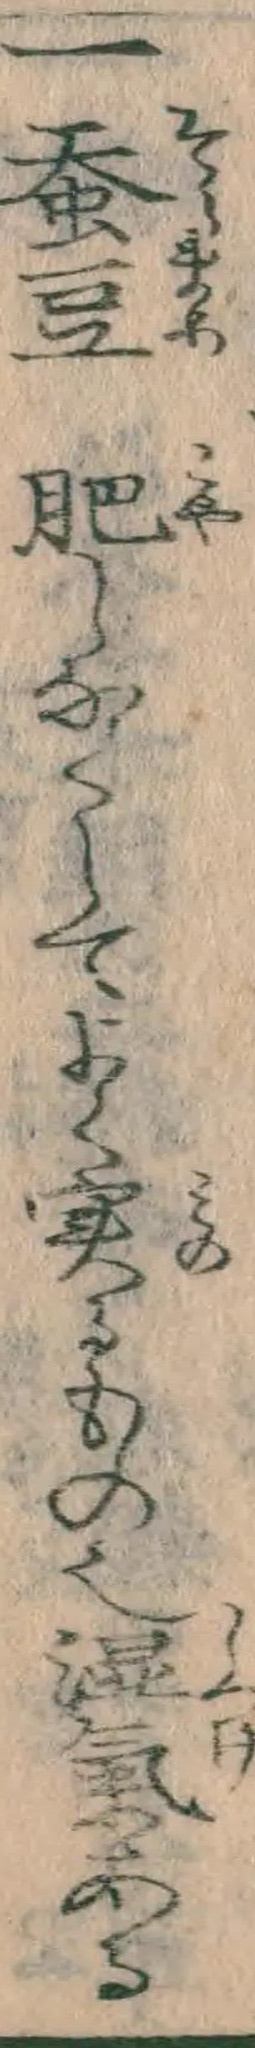一蚕豆肥しなくしてよく実るもの也湿気ある
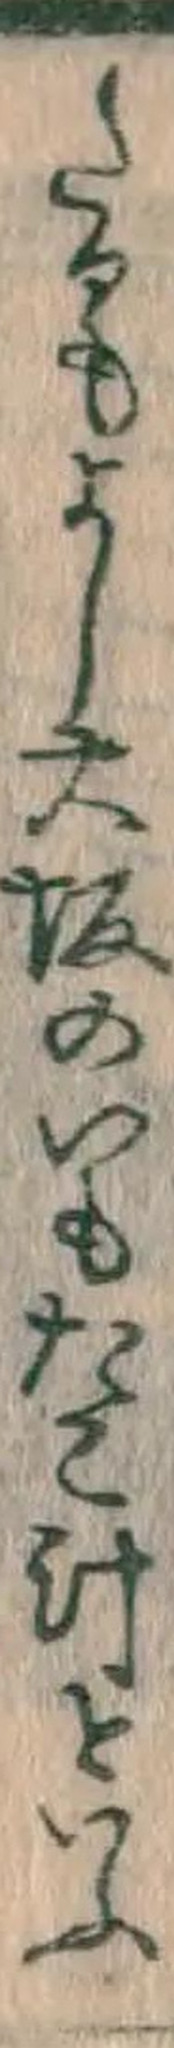たるもよし大坂のいもたこ汁といふ
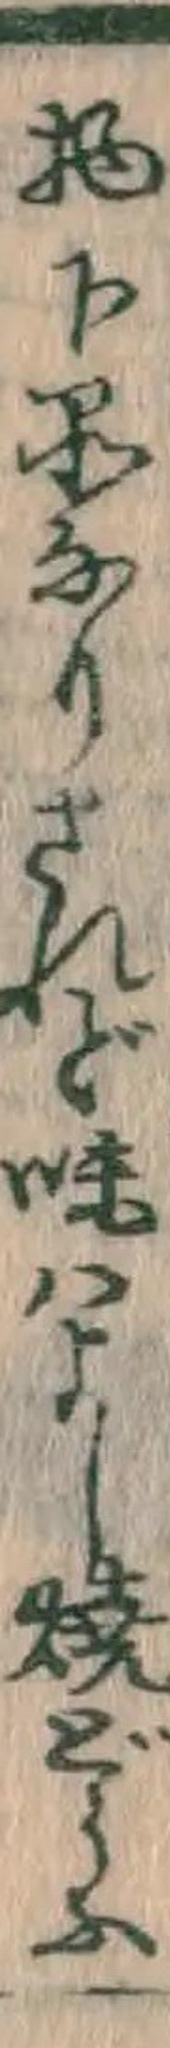物下品なりされど味はよし焼どうふ
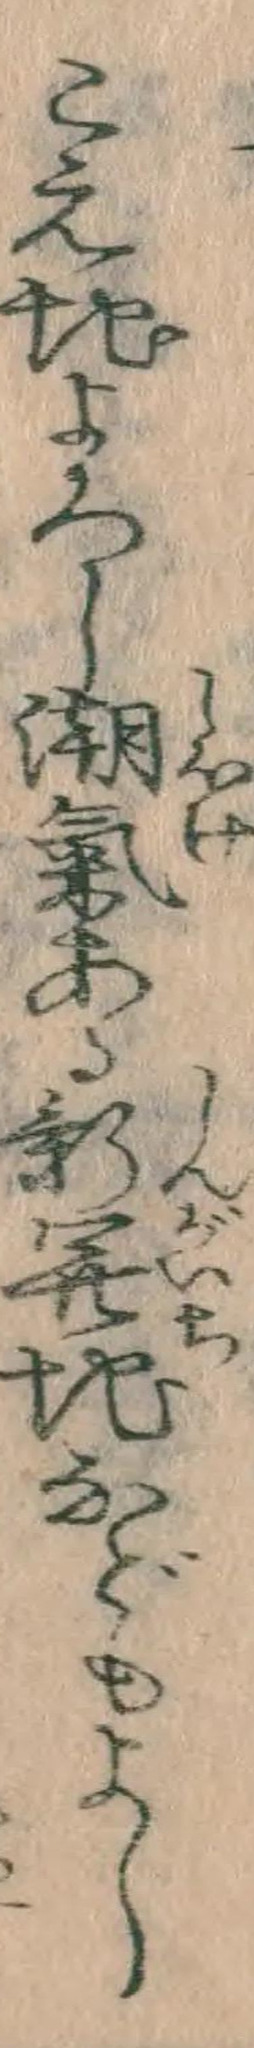こえ地よろし潮気ある新開地などもよし
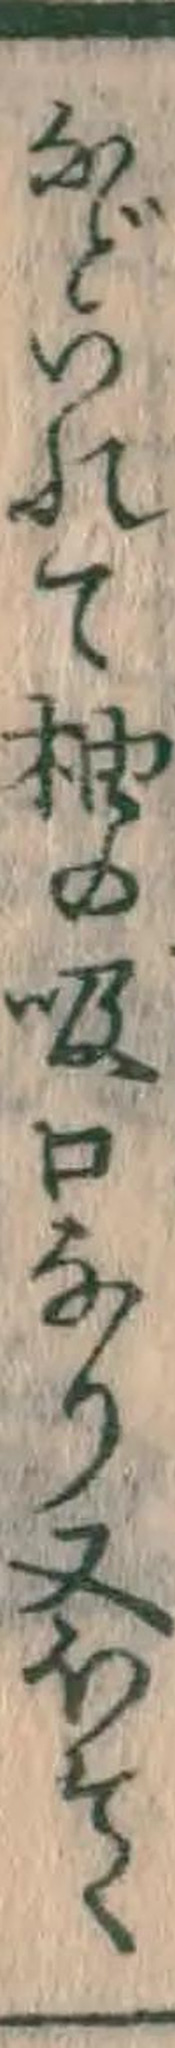などいれて柚の吸口なり又ほそく
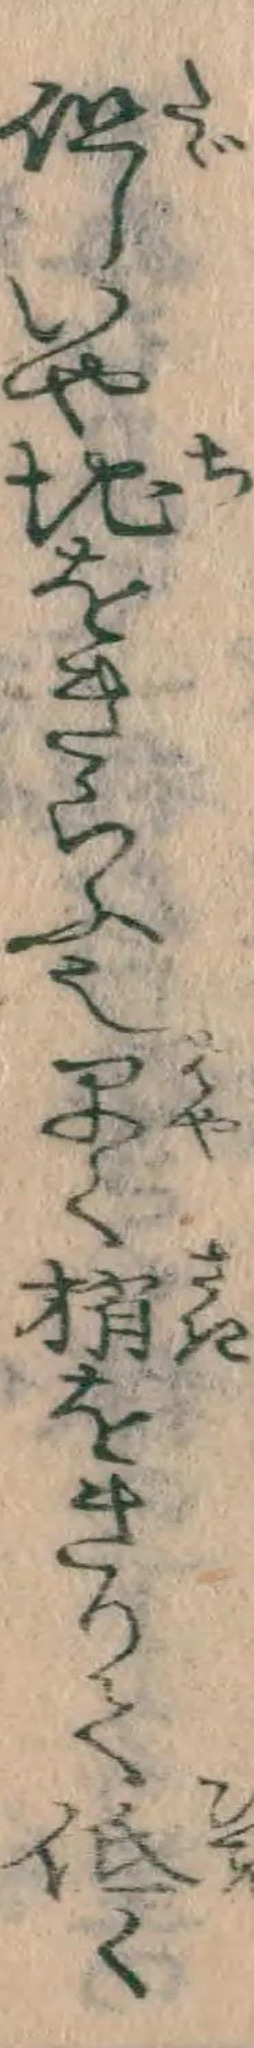但しいや地をきらふ也早く梢をきりて低く
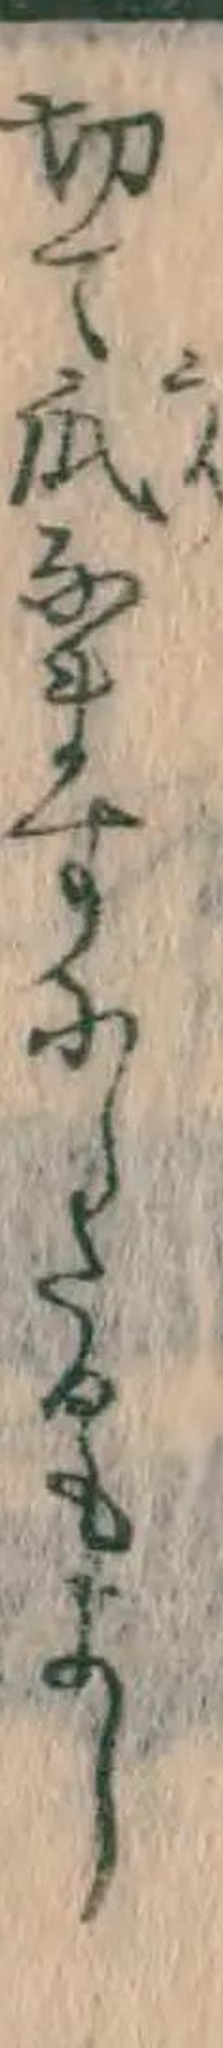切て瓜なますにしたるもよし
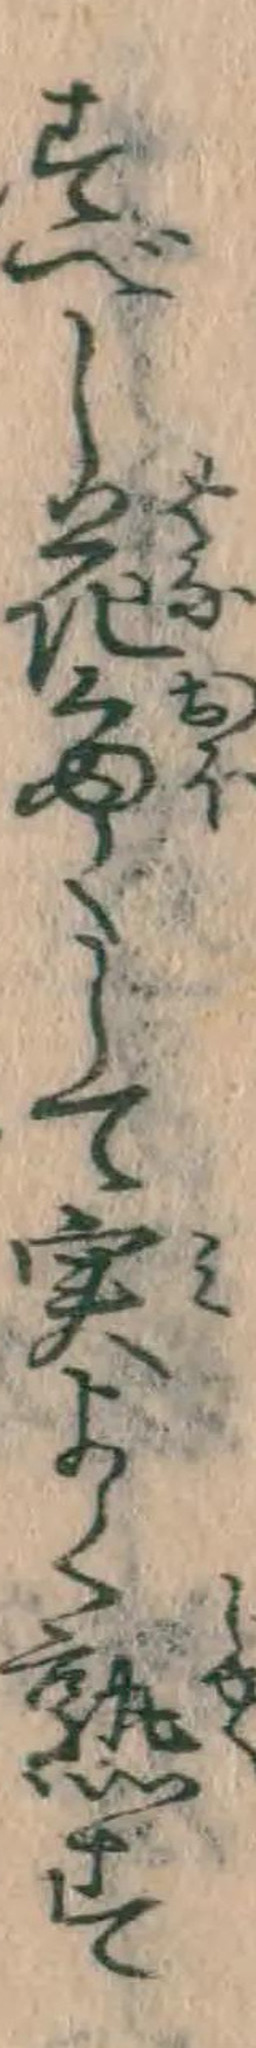すべし花多くして実よく熟す
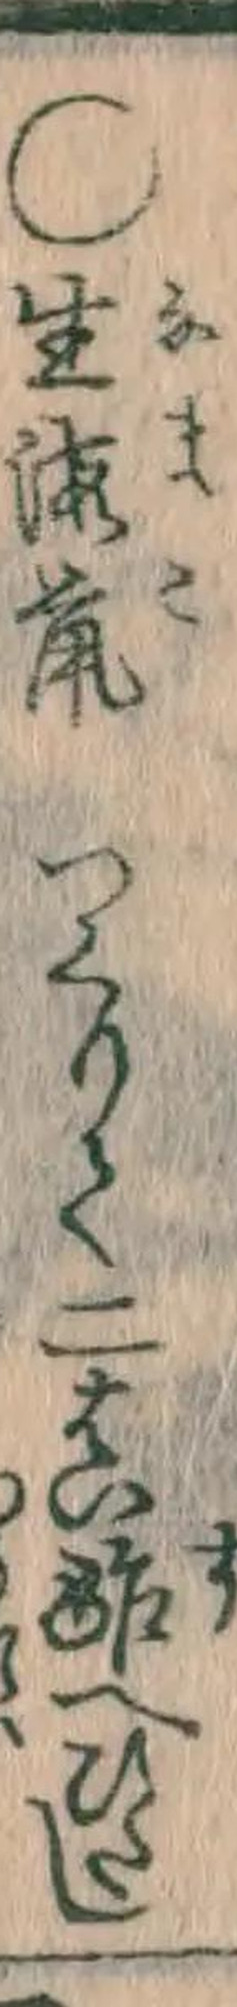○生海鼠つくりて二はい酢へひたし
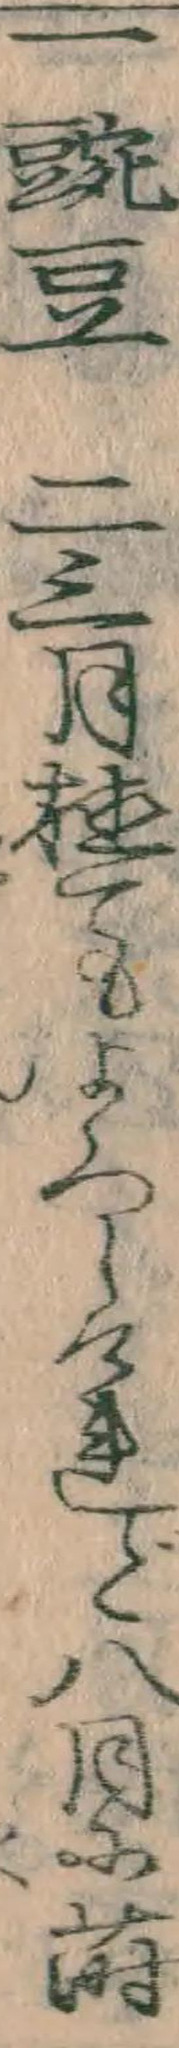一豌豆二三月植てもよろしけれど八月に蒔
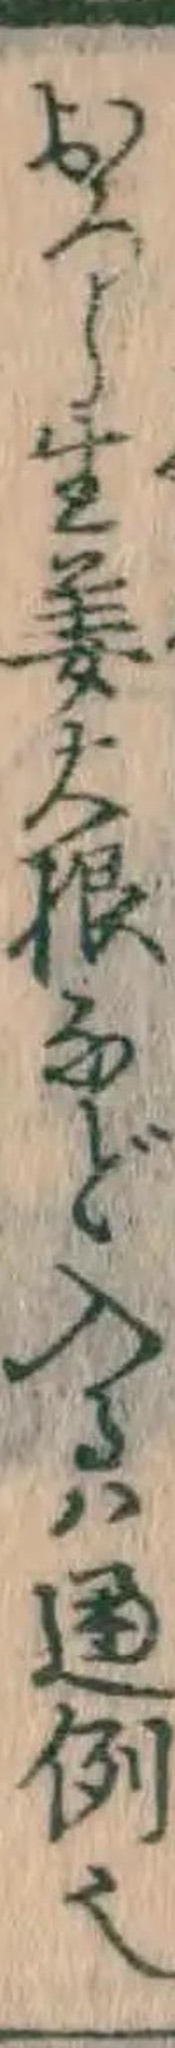おろし生姜大根など入るは通例也
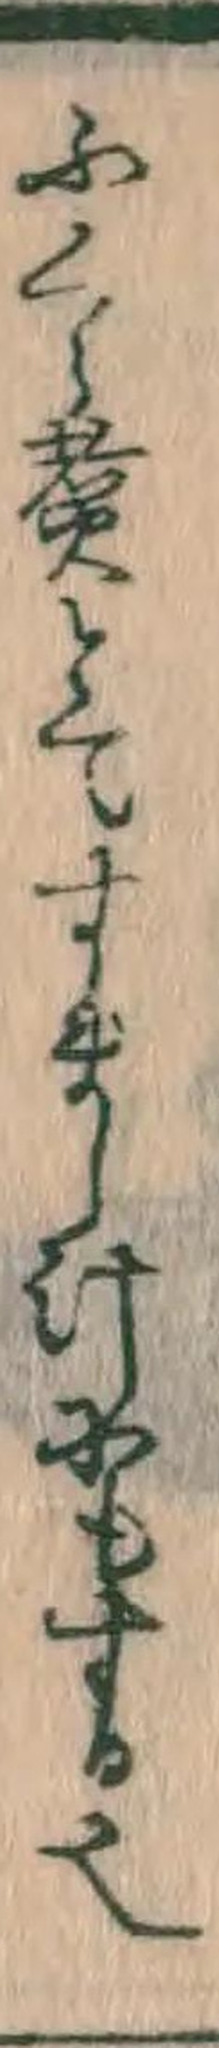ふくら煮とてすまし汁にもする也
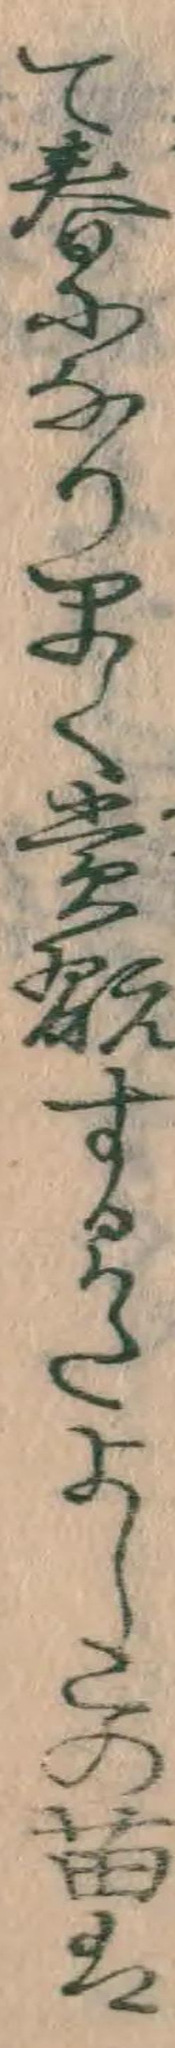て春になり早く賞翫するかたよしこの苗は
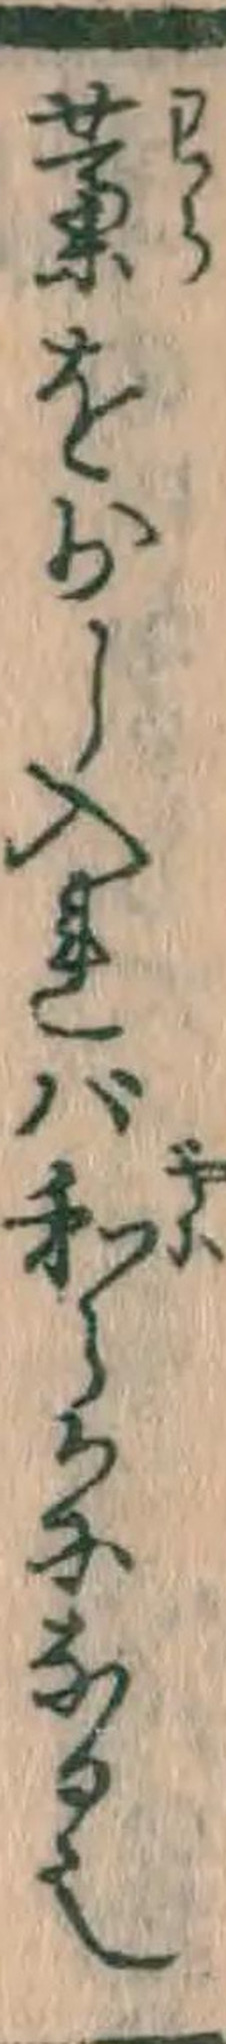藁を少し入れば和らかになる也
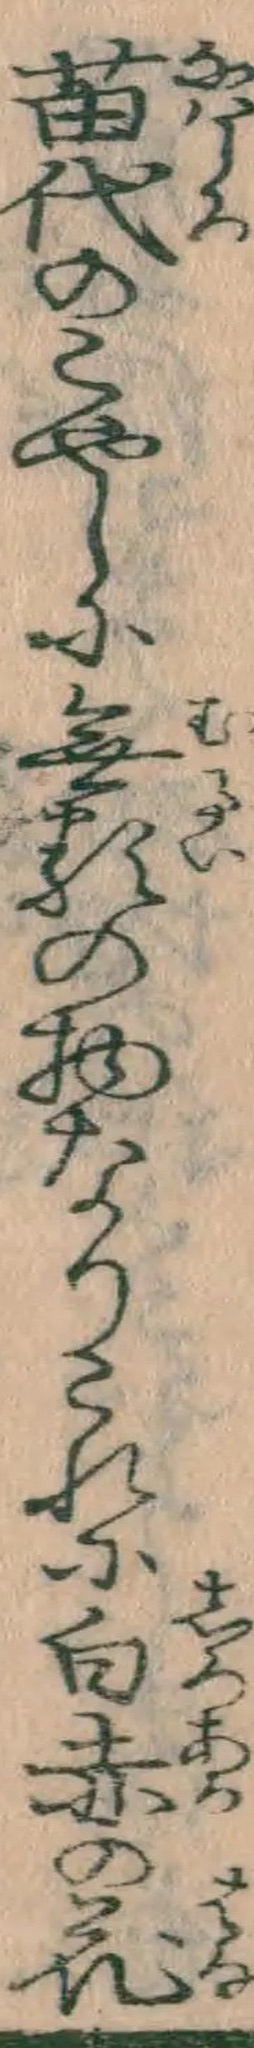苗代のこやしに無類の物なりこれに白赤の花
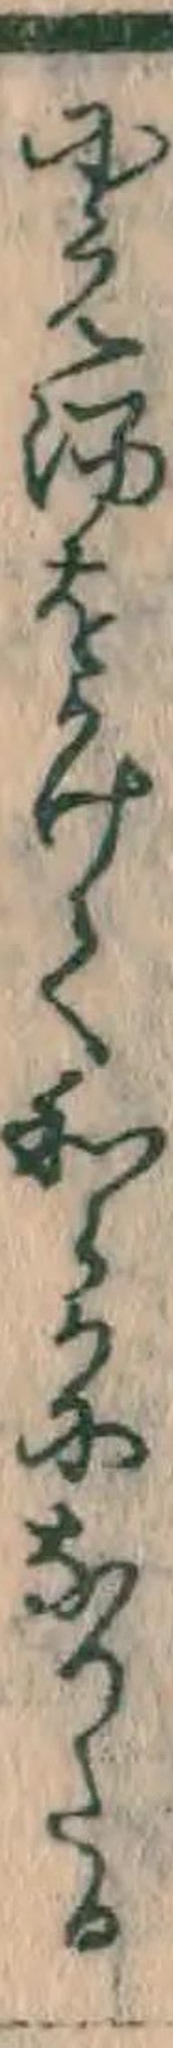にえ湯をかけて和らかになりたる
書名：広益秘事大全 3巻. [5]
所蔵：国立国会図書館 National Diet Library, JAPAN
